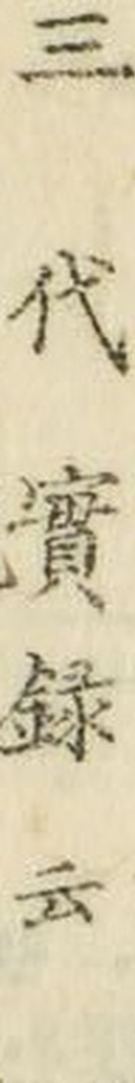三代實録云
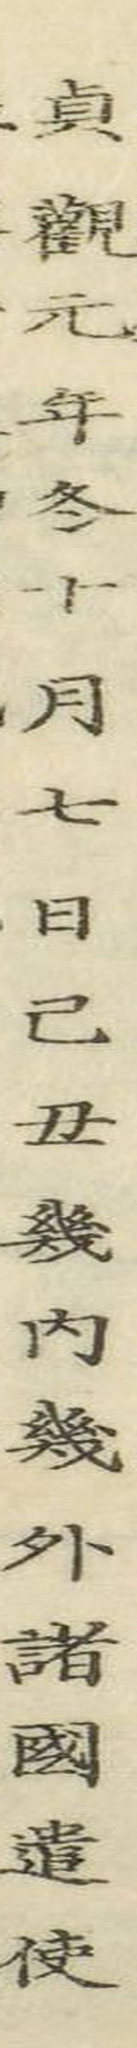貞觀元年冬十月七日己丑畿内畿外諸國遣使
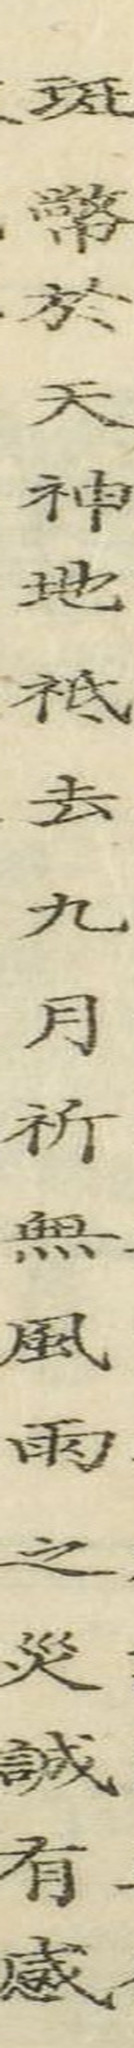班幣於天神地祇去九月祈無風雨之災誠有感
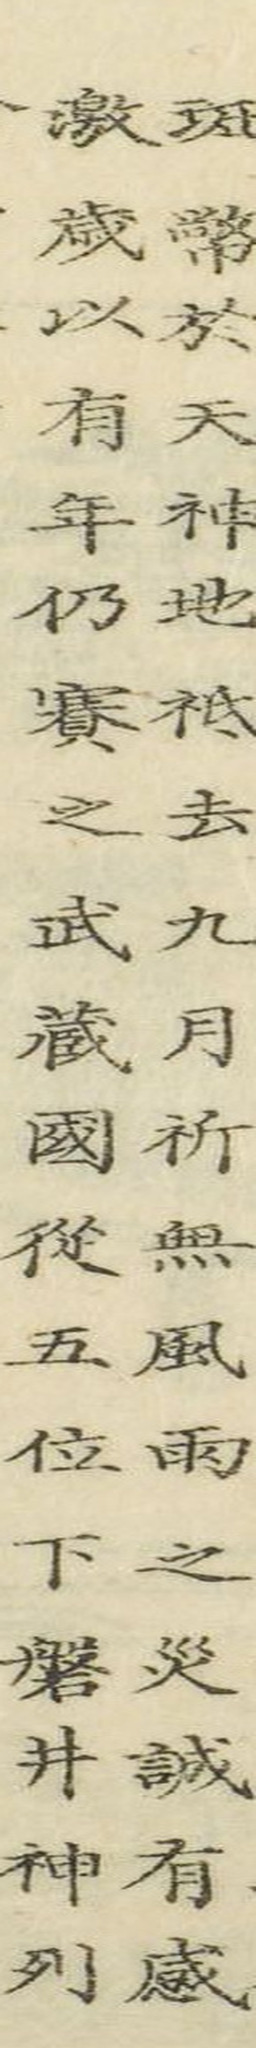激歳以有年仍賽之武藏國從五位下磐井神列

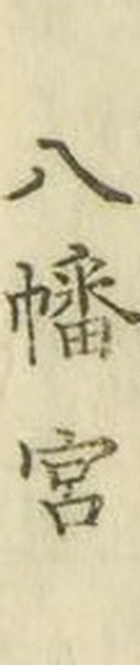八幡宮

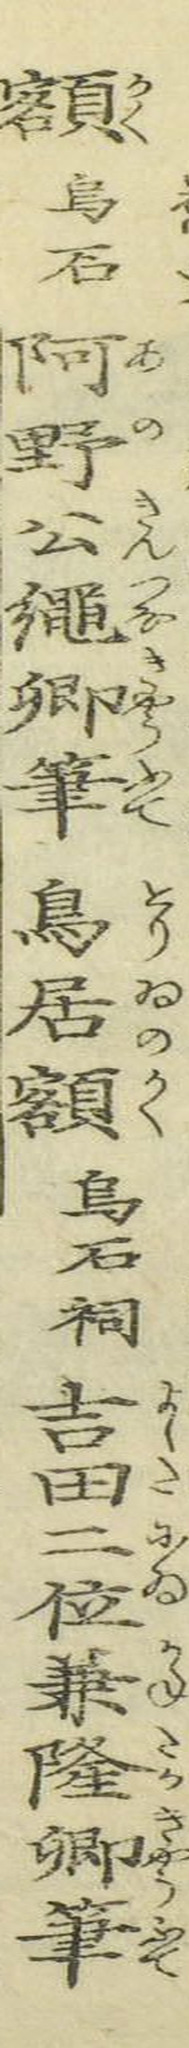額烏石阿野公繩卿筆鳥居額烏石祠吉田二位兼隆卿筆
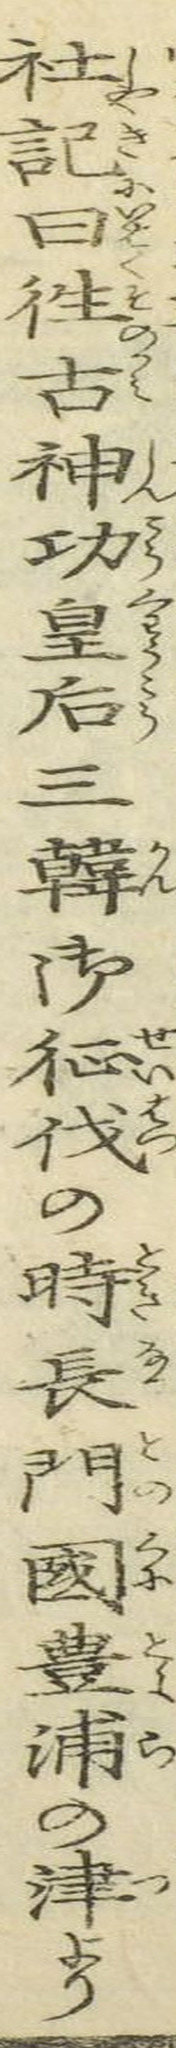社記曰往古神功皇后三韓御征伐の時長門國豊浦の津より
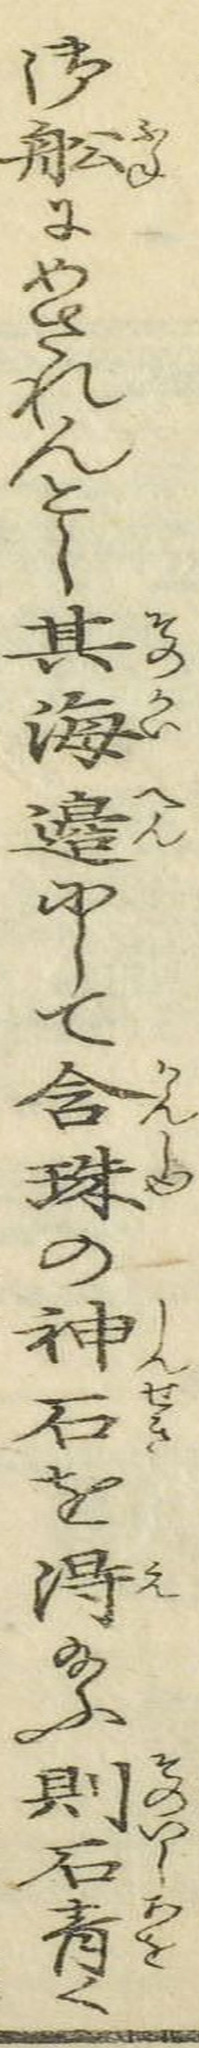御舩にめされんとし其海邊にして含珠の神石を得給ふ則石青く
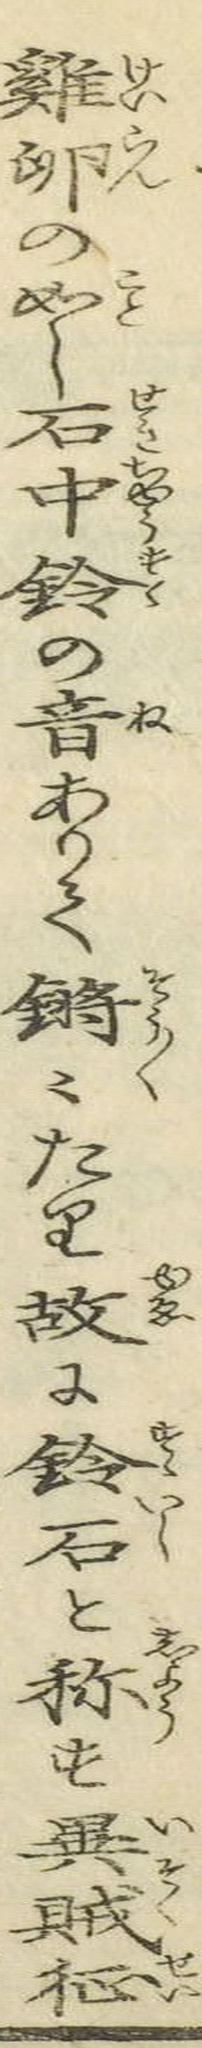雞卵の如し石中鈴の音ありて鏘々たり故に鈴石と称す異賊征
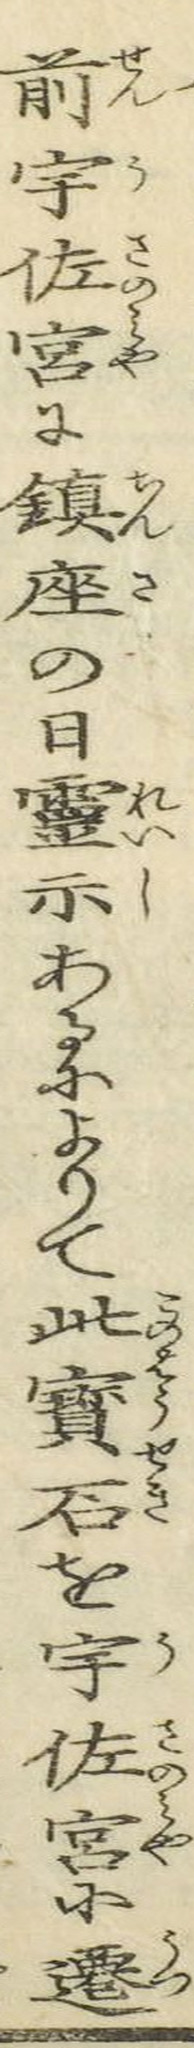前宇佐宮に鎮座の日靈示あるによりて此寳石を宇佐宮に遷
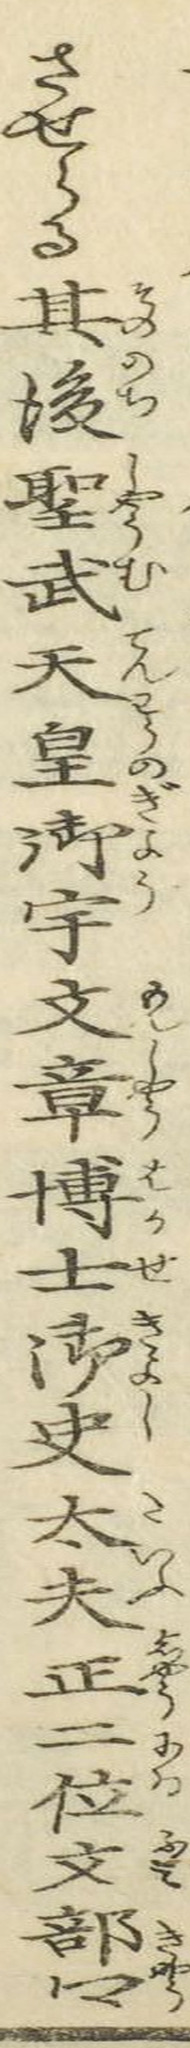させらる其後聖武天皇御宇文章博士御史太夫正二位文部卿
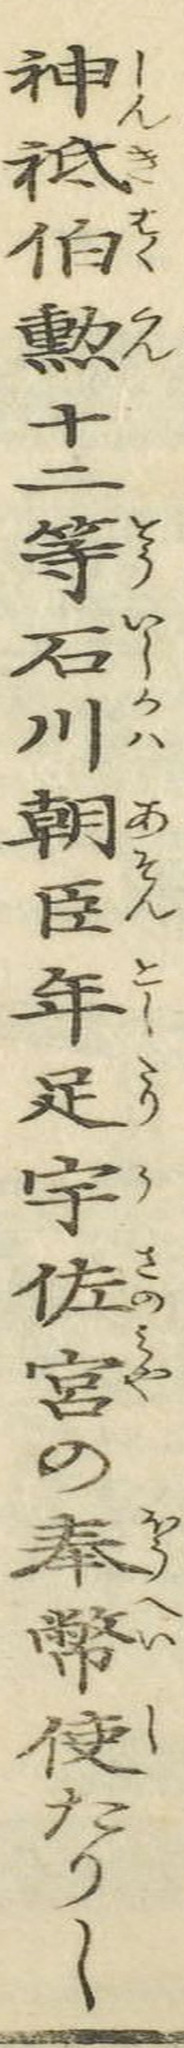神祇伯勲十二等石川朝臣年足宇佐宮の奉幣使たりし
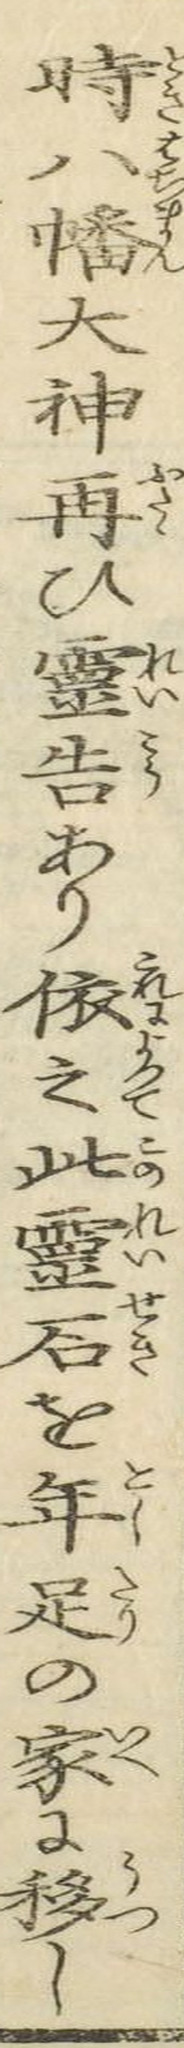時八幡大神再ひ靈告あり依之此靈石を年足の家に移し
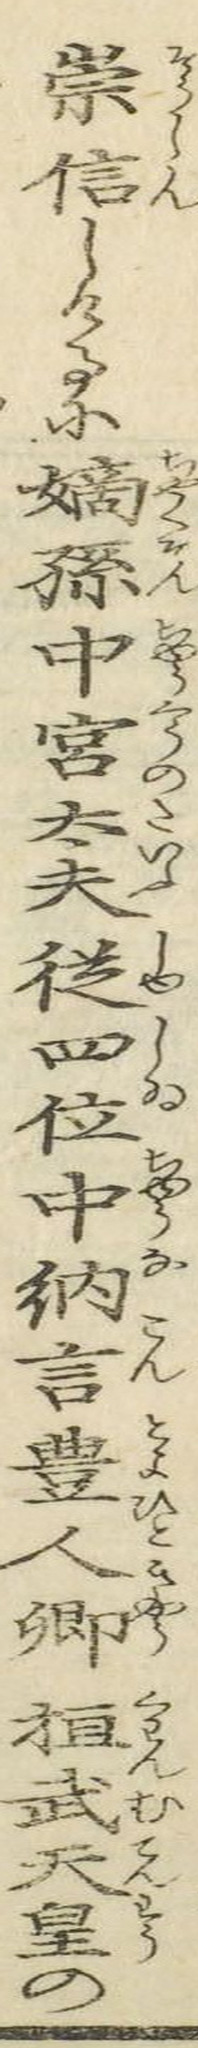崇信しけるに嫡孫中宮太夫従四位中納言豊人卿桓武天皇の
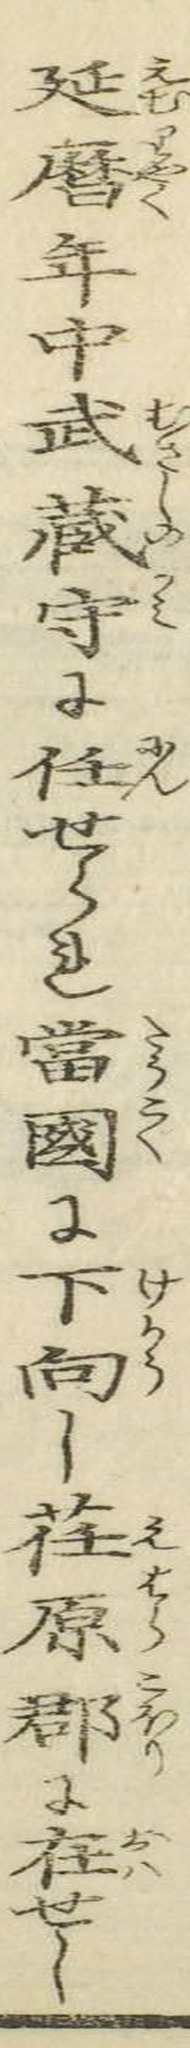延暦年中武藏守に任せられ當國に下向し荏原郡に在せし
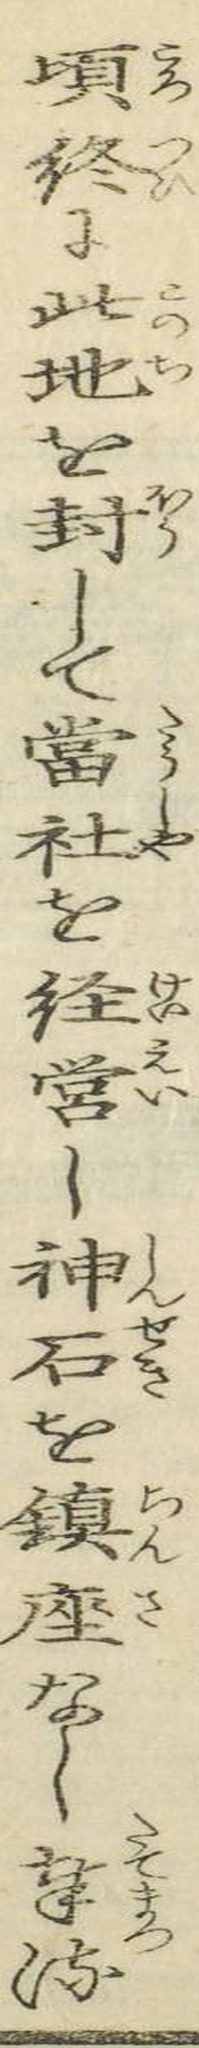頃終に此地を封して當社を経営し神石を鎮座なし奉る
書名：江戸名所図会 20巻 巻之4
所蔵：東京学芸大学教育コンテンツアーカイブ
